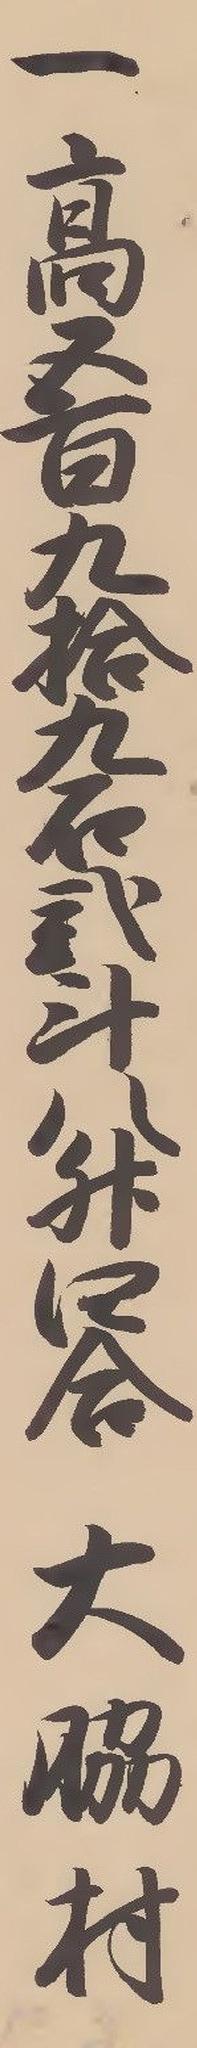一高五百九拾九石弐斗八升四合大脇村
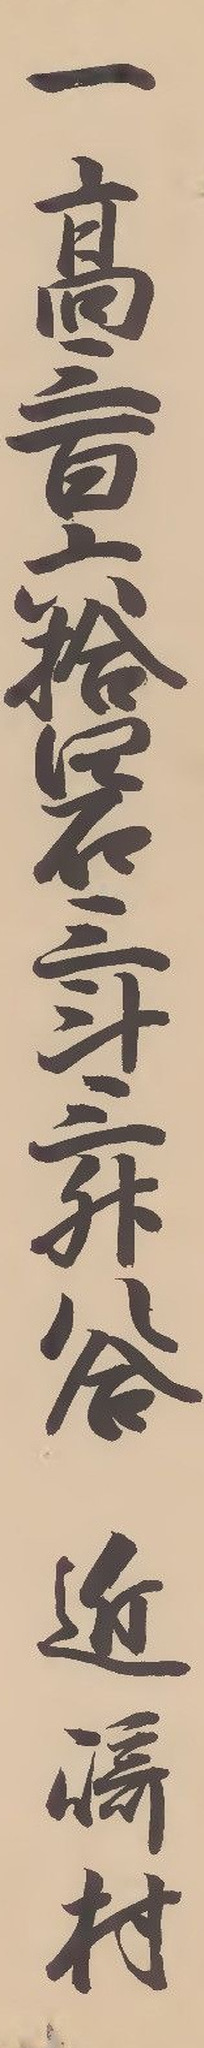一高三百六拾四石三斗三升八合近崎村
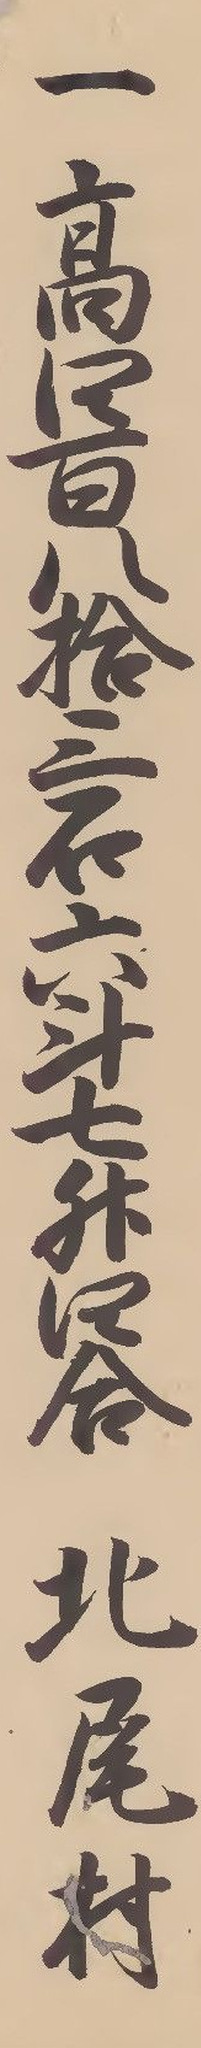一高四百八拾三石六斗七升四合北尾村
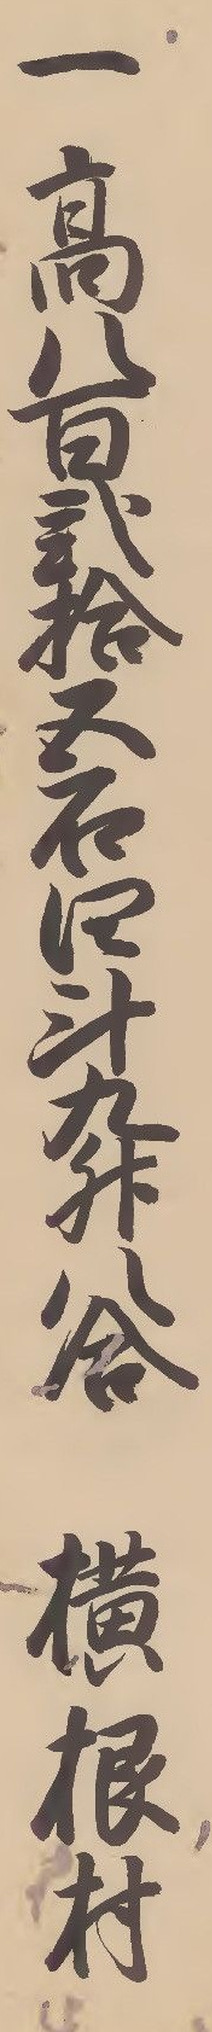一高八百弐拾五石四斗九升八合横根村

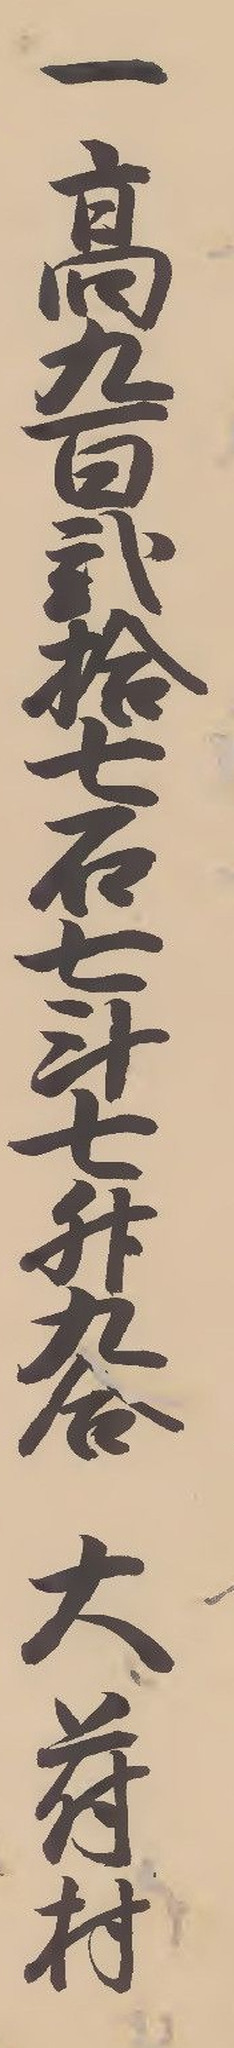一高九百弐拾七石七斗七升九合大府村
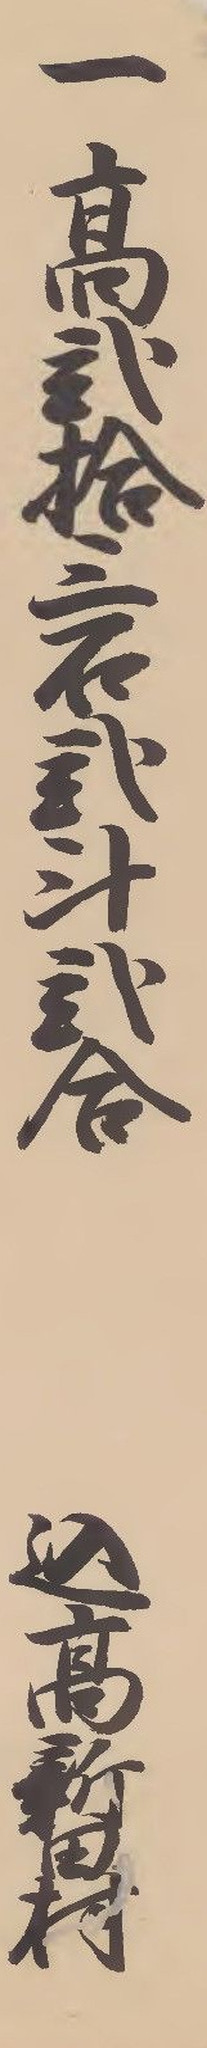一高弐拾三石弐斗弐合込高新田村
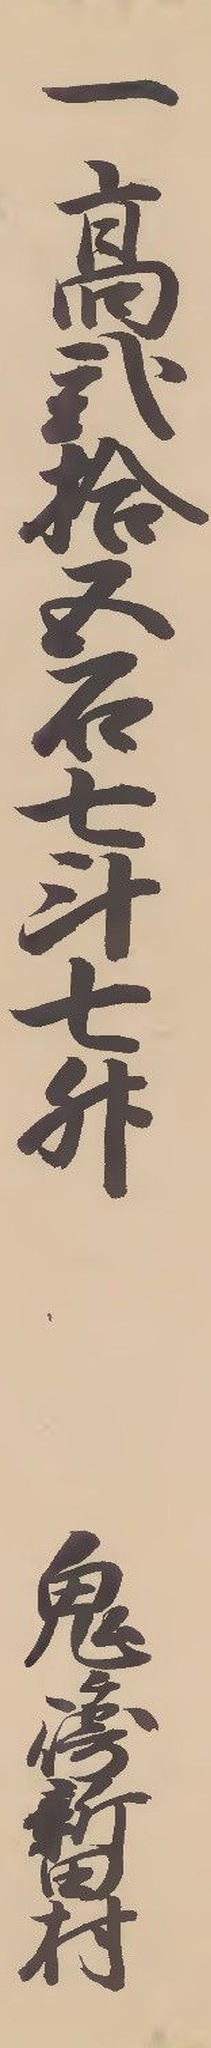一高弐拾五石七斗七升鬼崎新田村
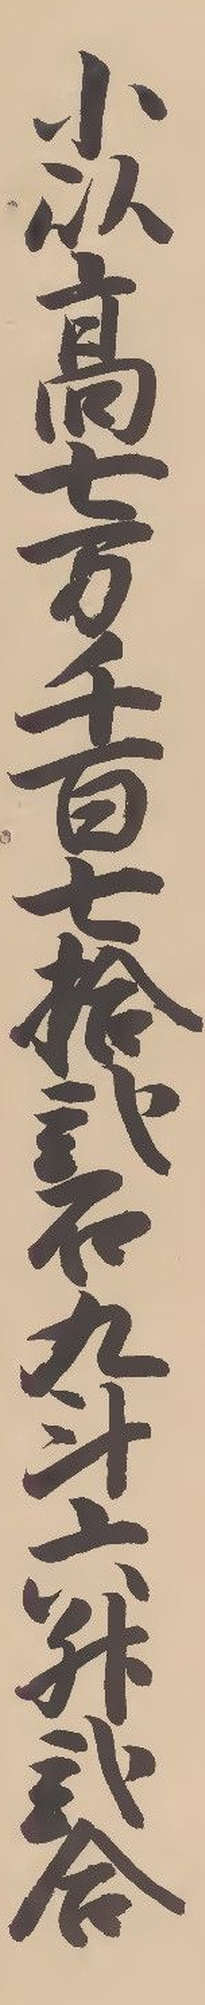小以高七万千百七拾弐石九斗六升弐合
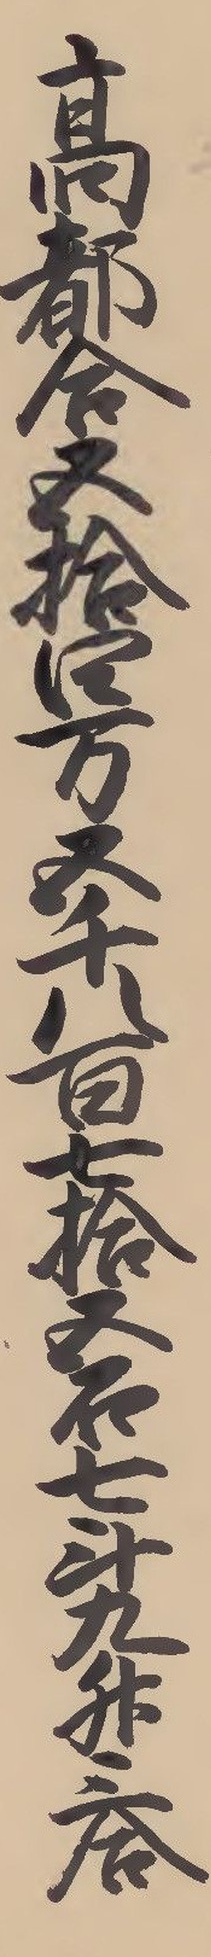高都合五拾四万五千八百七拾五石七斗九升三合
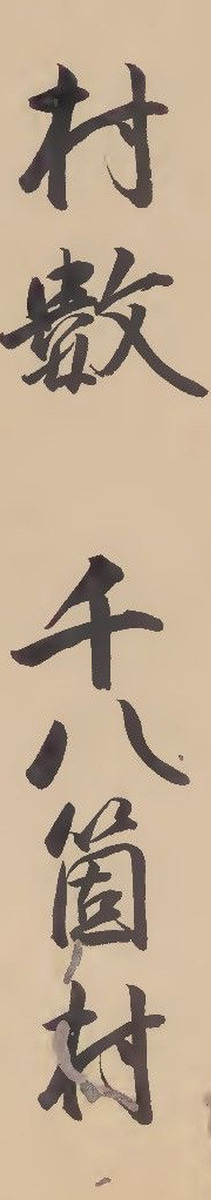村数千八箇村

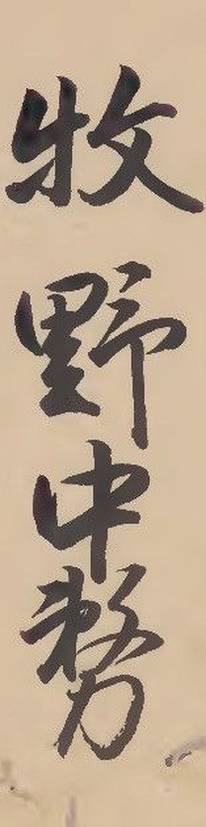牧野中務
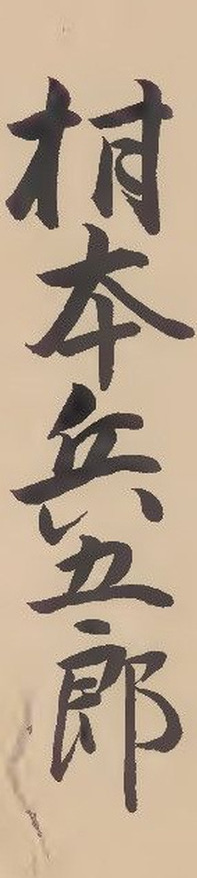柑本兵五郎
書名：尾張国郷帳
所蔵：国立公文書館 National Archives of Japan
